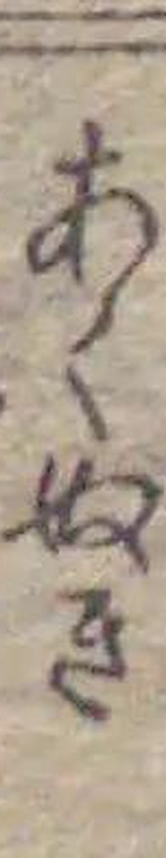あくぬき
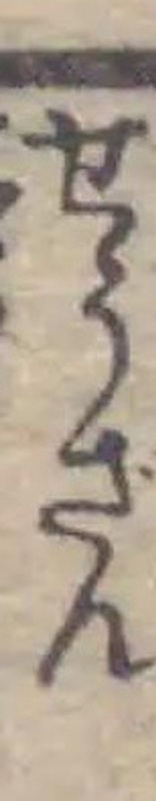せうざん
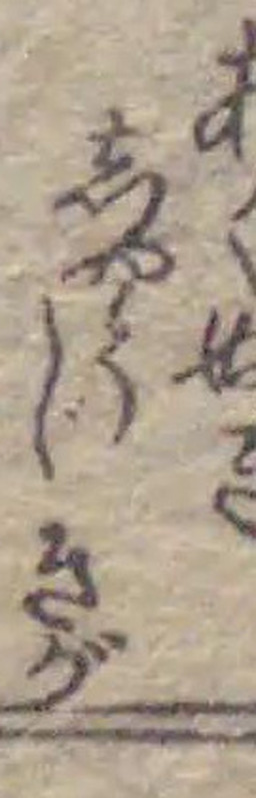しやうじの
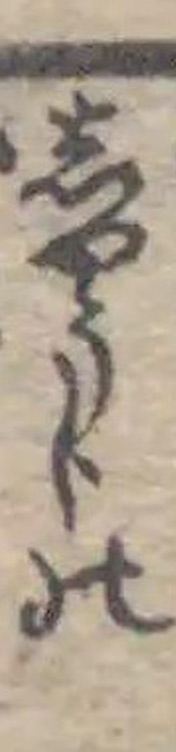しやうじの
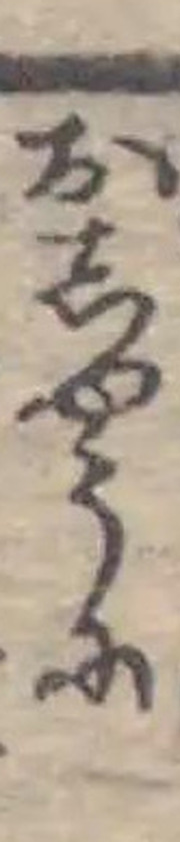おしやうに
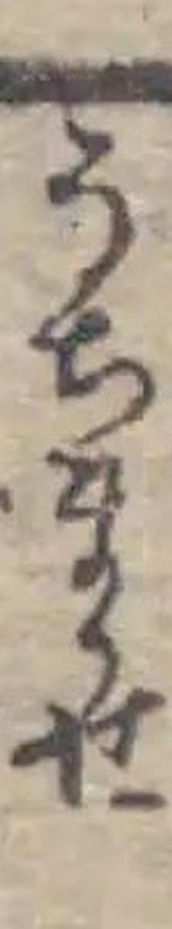うちまかせ
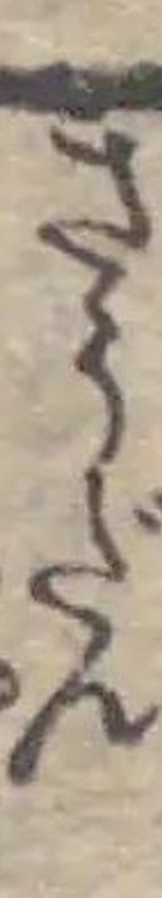さうだん
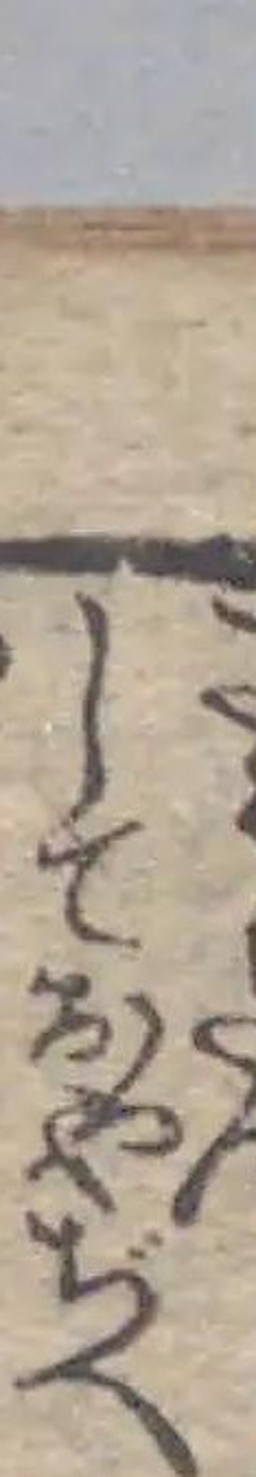しておやぢへ
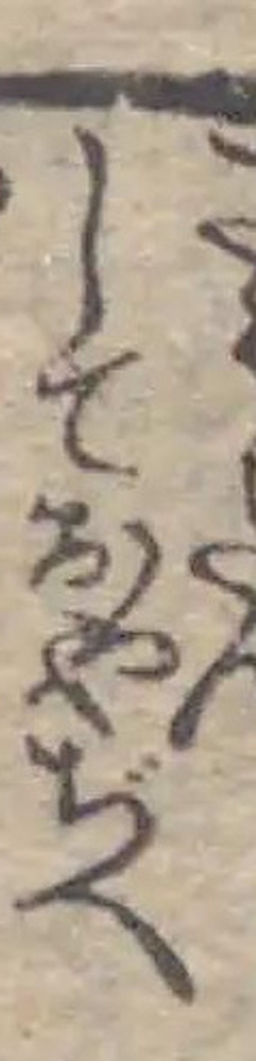しておやぢへ
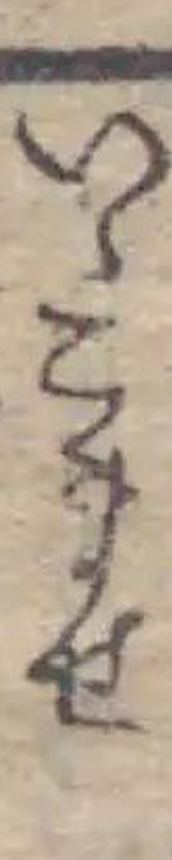いゝこませ
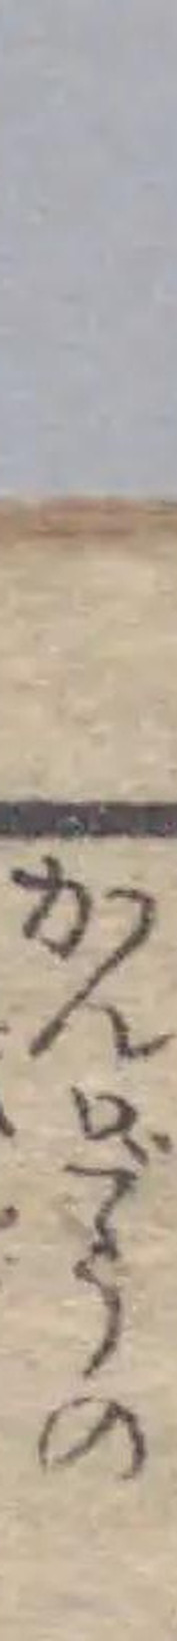かんどうの
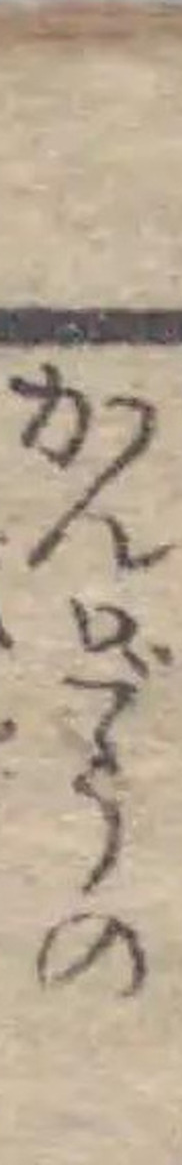かんどうの
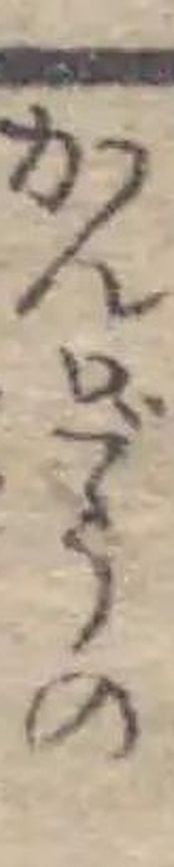かんどうの
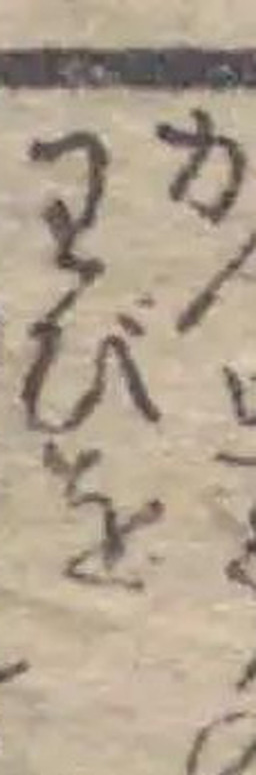わびを
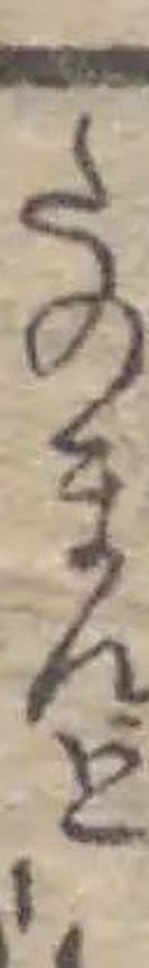たのまんと
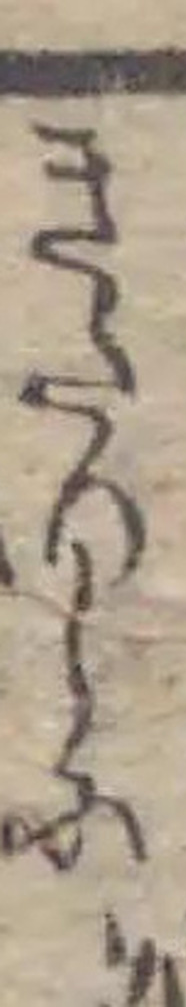きたりしに
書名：福壽海旡量品玉 3巻
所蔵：国立国会図書館 National Diet Library, JAPAN
